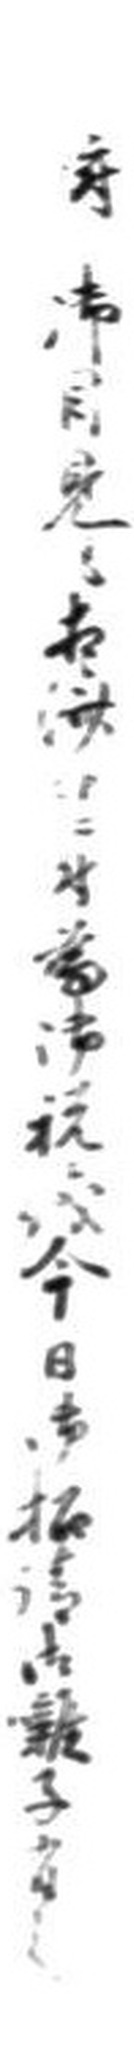府御目見も相済候ニ付為御祝儀今日御招請御囃子有之
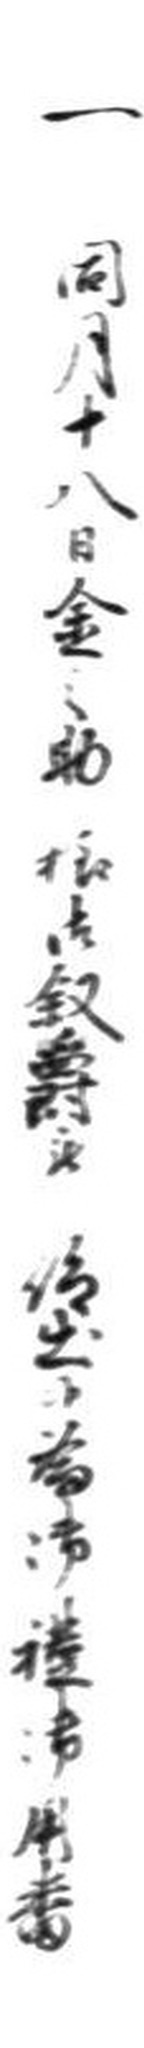一同月十八日金之助様御叙爵被仰出候為御礼御用番
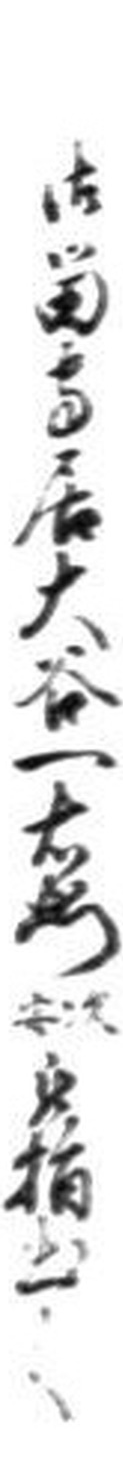御留守居大谷一右衛門次安被指出之
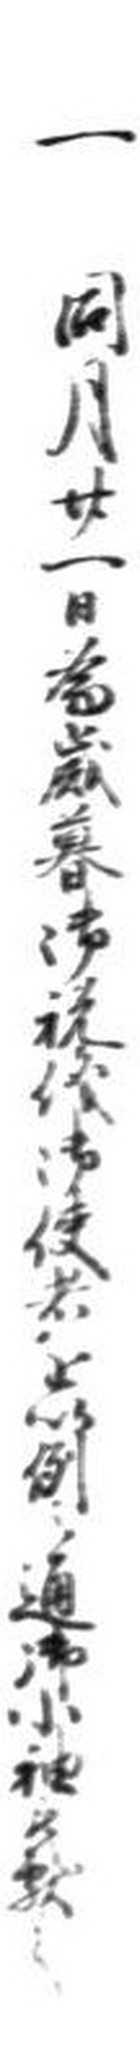一同月廿一日為歳暮御祝儀御使者を以例之通御小袖被献之
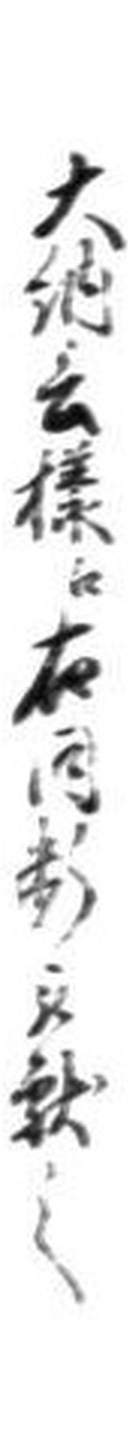大納言様江右同断被献之

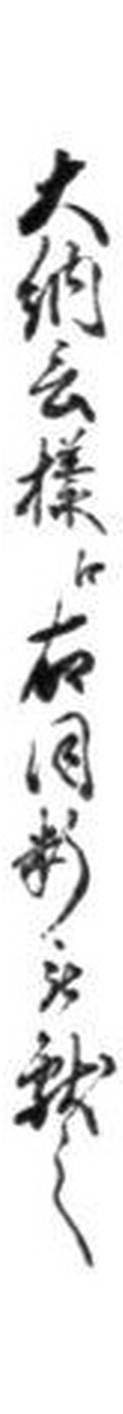大納言様江右同断被献之
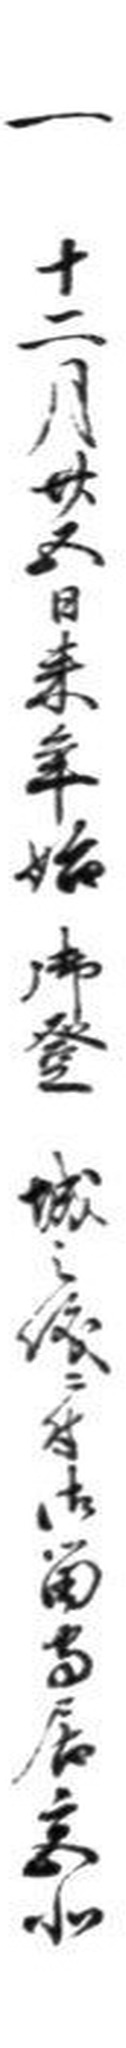一十二月廿五日来年始御登城之儀ニ付御留守居宮北
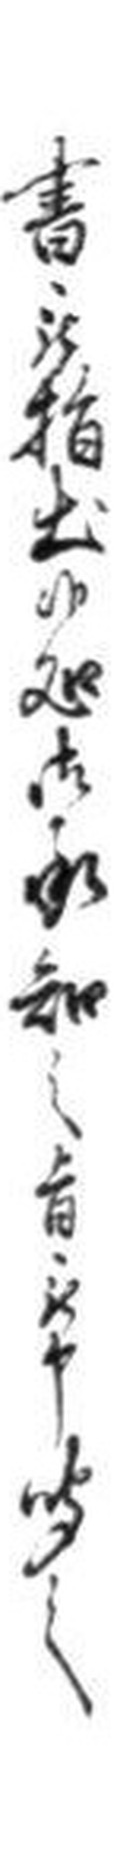書被指出候処御承知之旨被申聞之
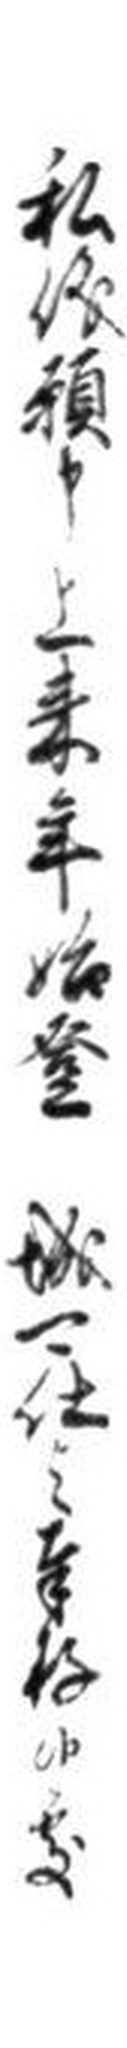私儀願申上来年始登城可仕之奉存候処
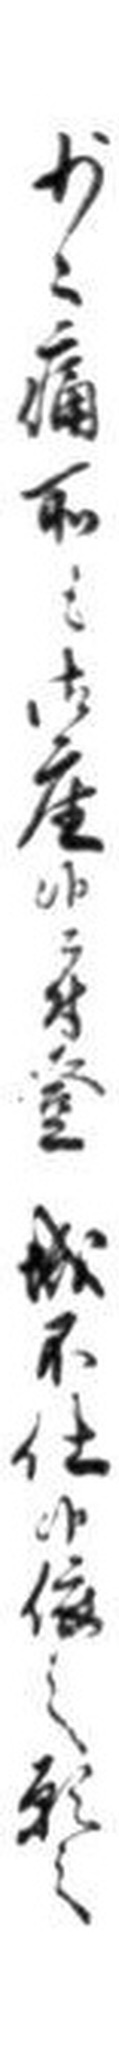少々痛所も御座候ニ付登城不仕候依之願之
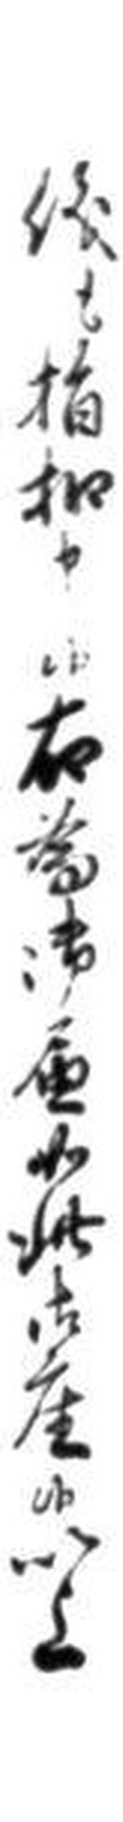儀も指扣申候右為御届如此御座候以上
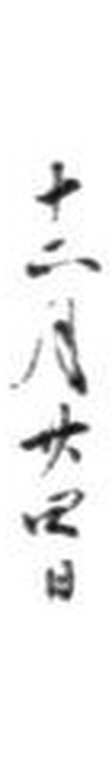十二月廿四日
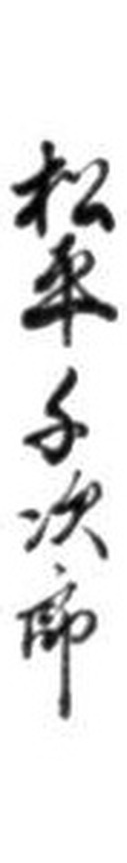松平千次郎
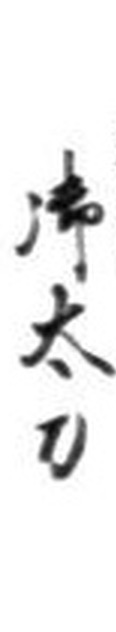御太刀
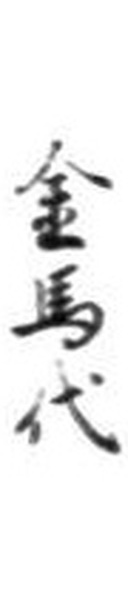金馬代
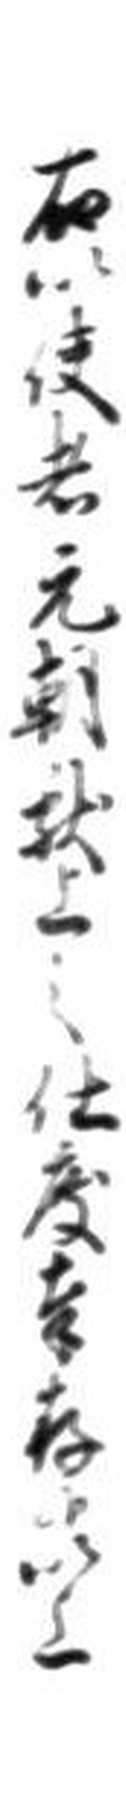右以使者元朝献上之仕度奉存候以上
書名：家譜 三十九 宗矩公 享保十年
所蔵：福井県文書館 Fukui Prefectural Archives
